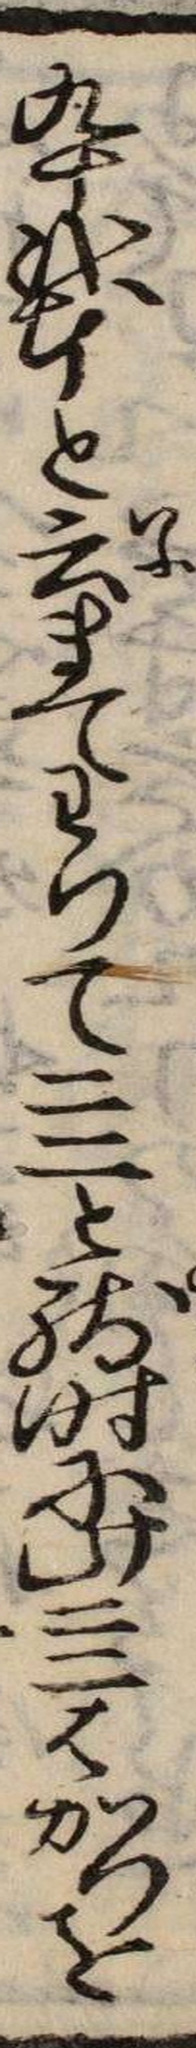九十弐本と云まてわりて二二と残時に此二二はかりを
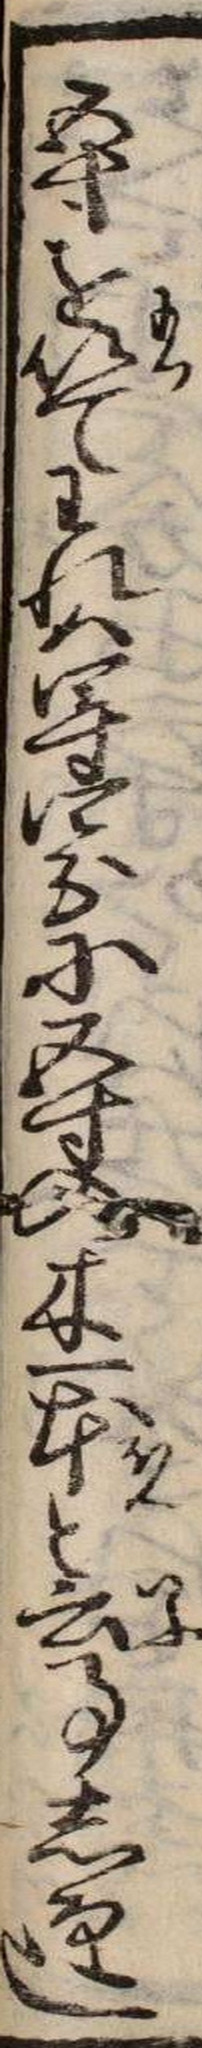五寸を以てわれは四寸四分に五寸の木一本と云事しるゝ也
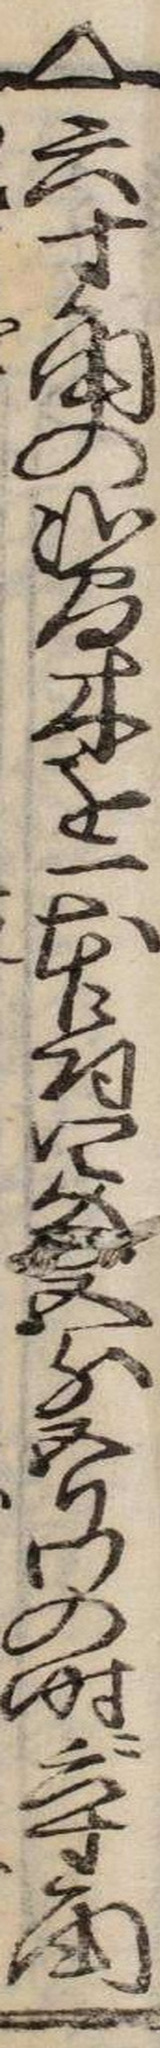△六寸角の弐間木を一本に付四匁五分五りつゝの時に六寸角
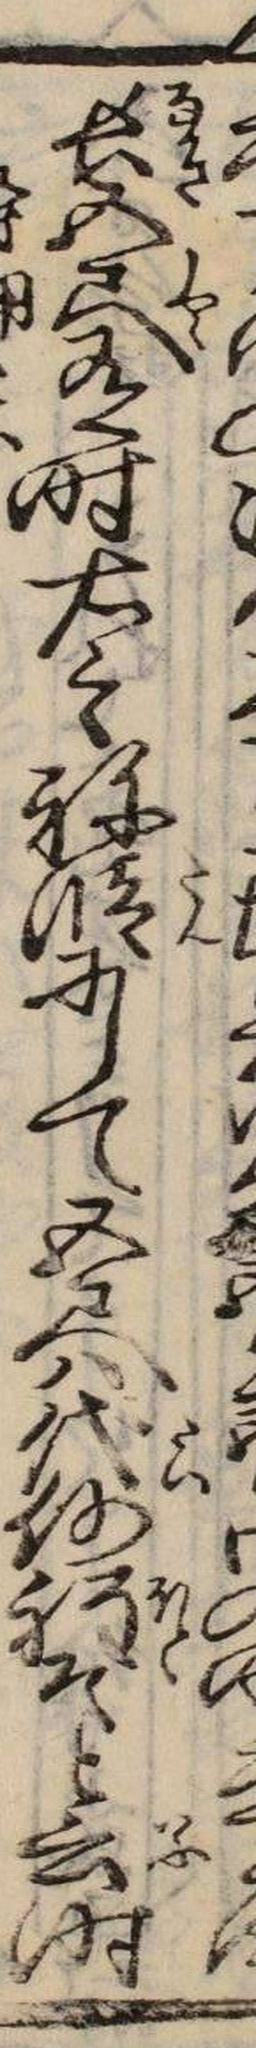長五尺有時右のね段にして五尺は代何程そと云時
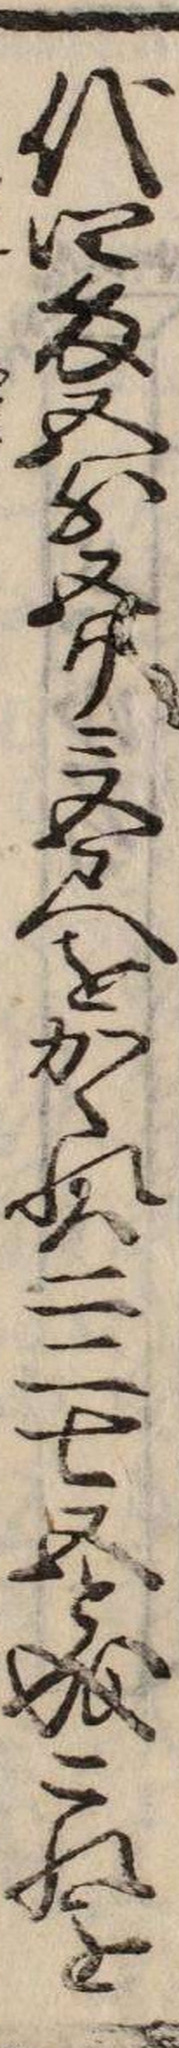代四匁五分五りに五尺をかくれは二二七五と成これを
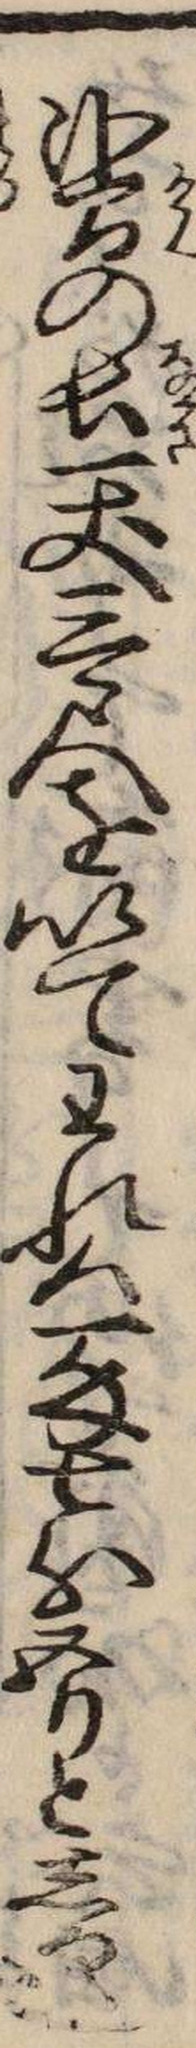弐間の長一丈三尺を以てわれは一匁七分五りとしるゝ也し
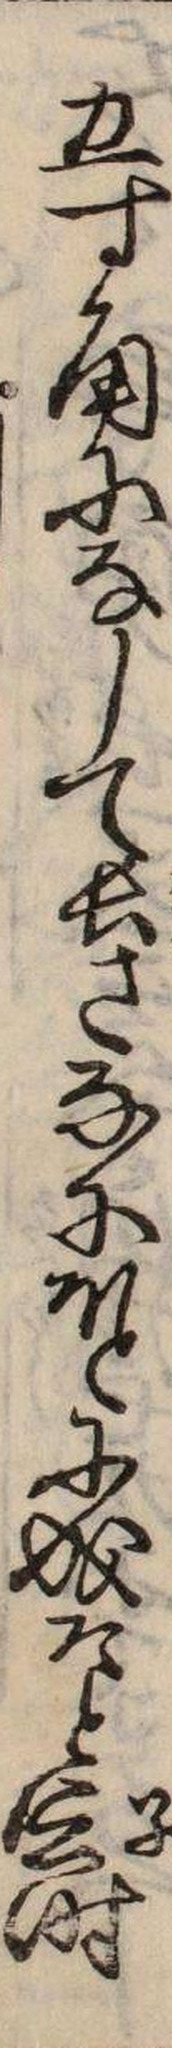五寸角になして長さなにほとに成そと云時
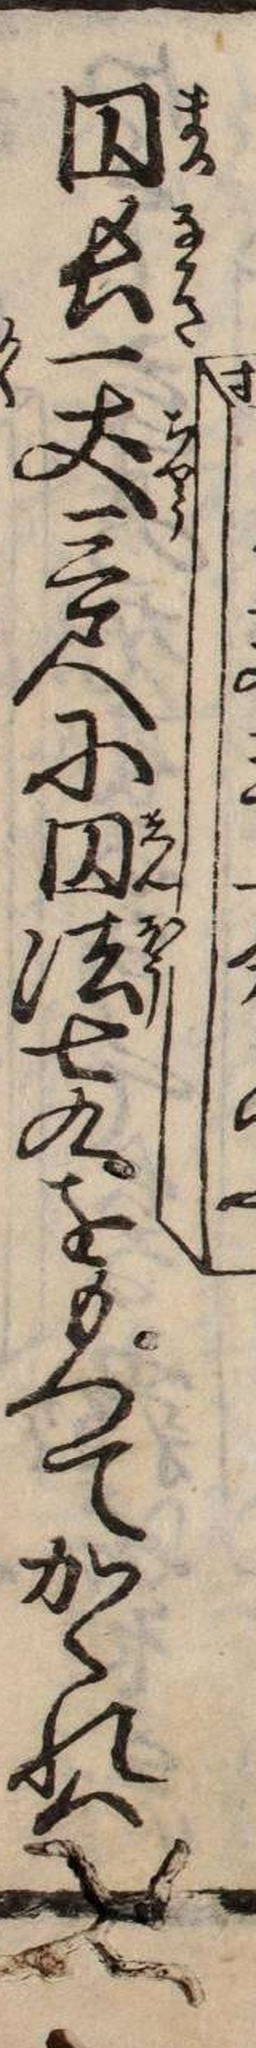円長一丈三尺に円法七九をもつてかくれは
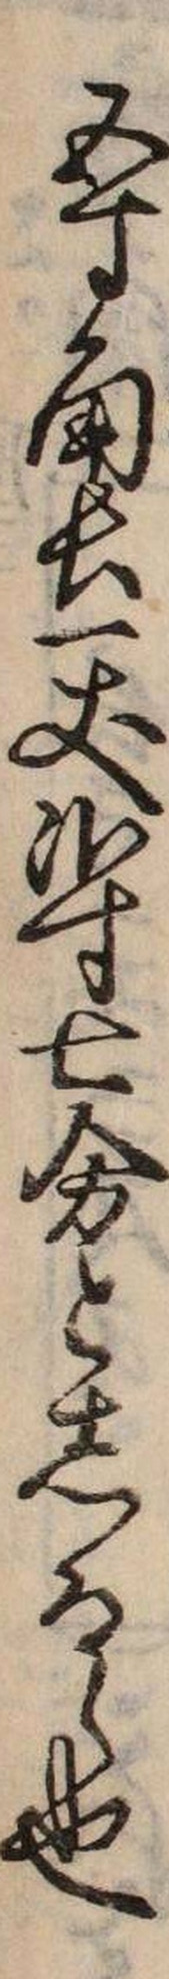五寸角長一丈弐寸七分としるゝ也

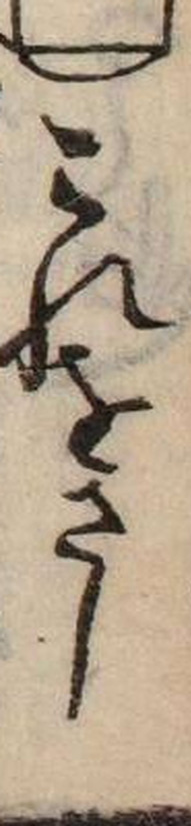これをさし
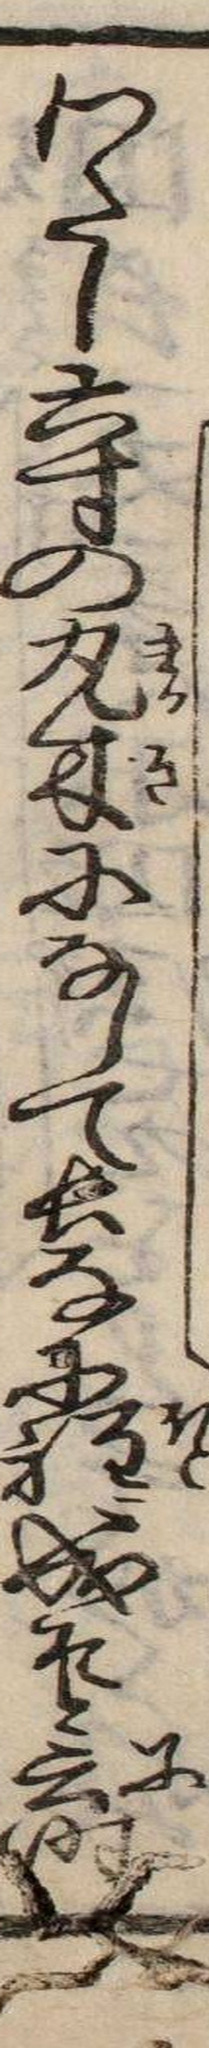わたし六寸の丸木になして長なに程に成そと云時
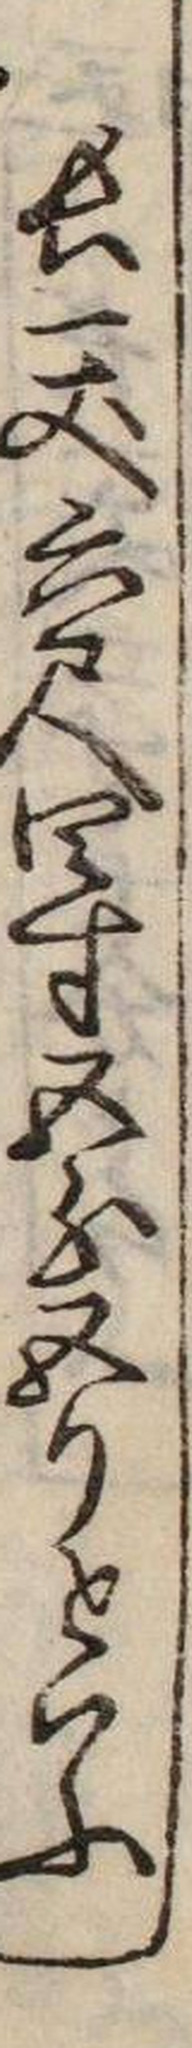六寸長一丈六尺四寸五分五りといふ
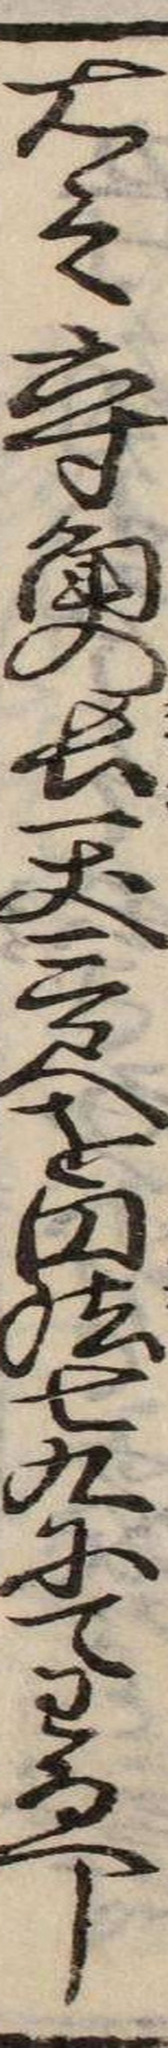右の六寸角の長一丈三尺を円法七九にてわるへし
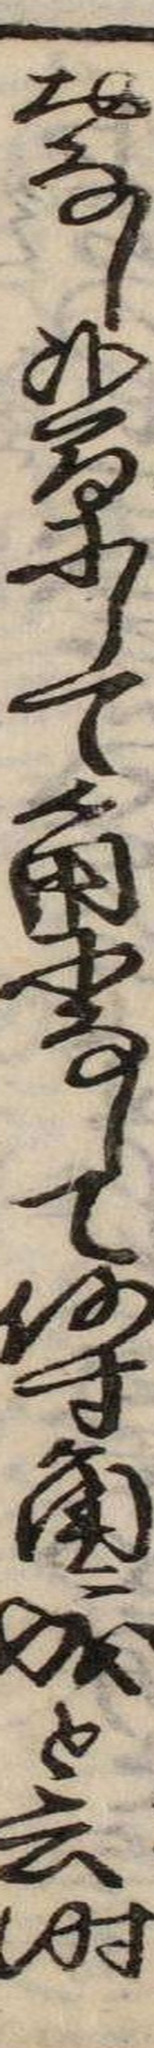おなし弐間にして角になして何寸角に成と云時
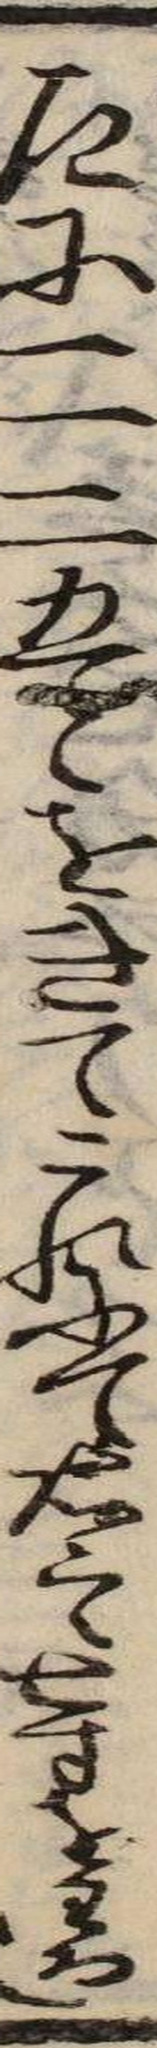左に一一二五とをきてこれにて右の七寸をわる也
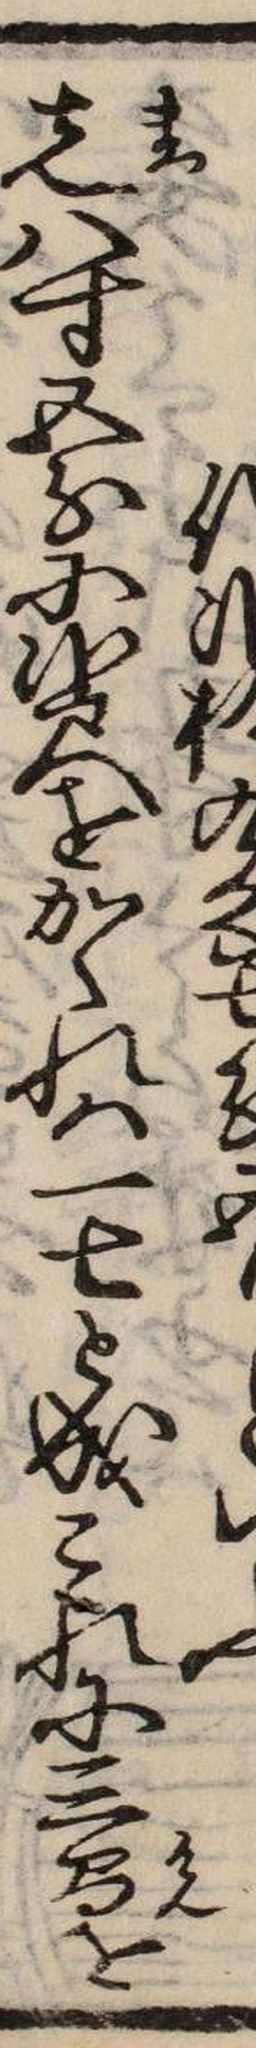先八寸五分に弐尺をかくれは一七と成これに三間を
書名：塵劫記（寛永11年自跋、京都府立京都学・歴彩館追貴8）
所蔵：京都府立京都学・歴彩館 国文学研究資料館
